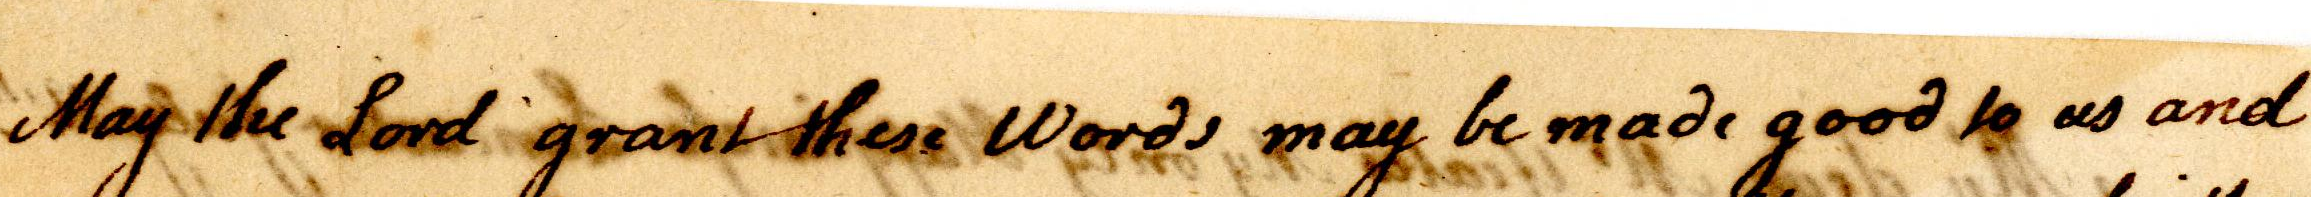May the Lord grant these Words may be made good to us and
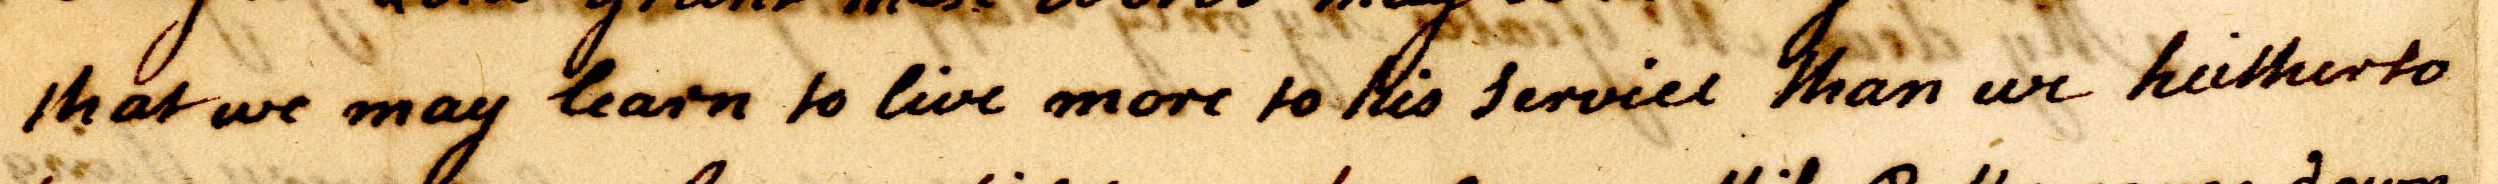that we may learn to live more to his Service Than we hitherto
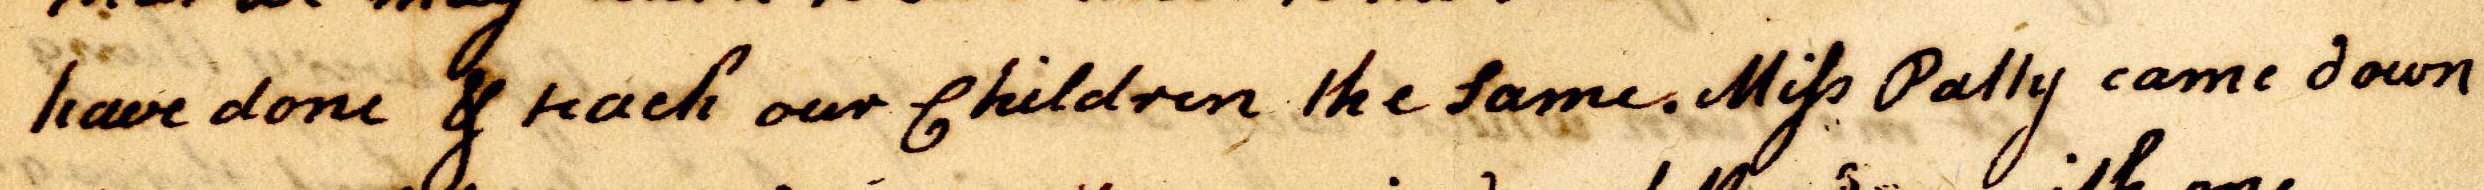have done & teach our Children the same. Miss Patty came down
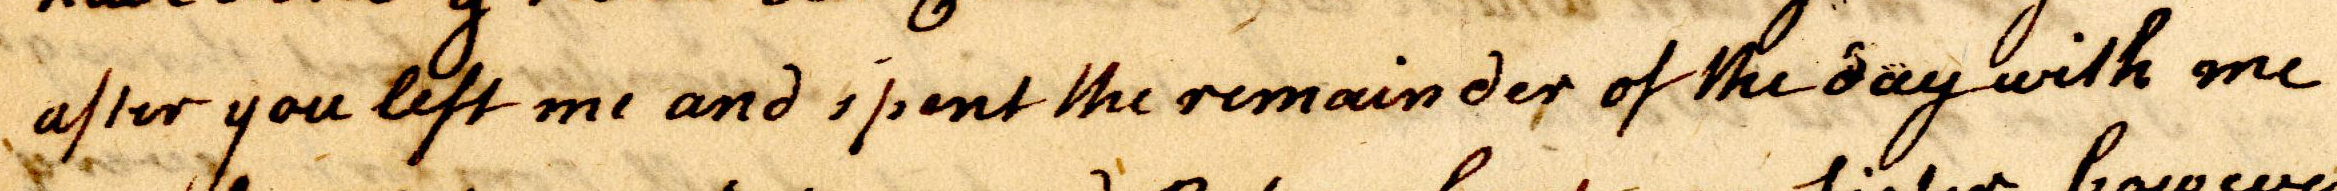after you left me and spent the remainder of the day with me
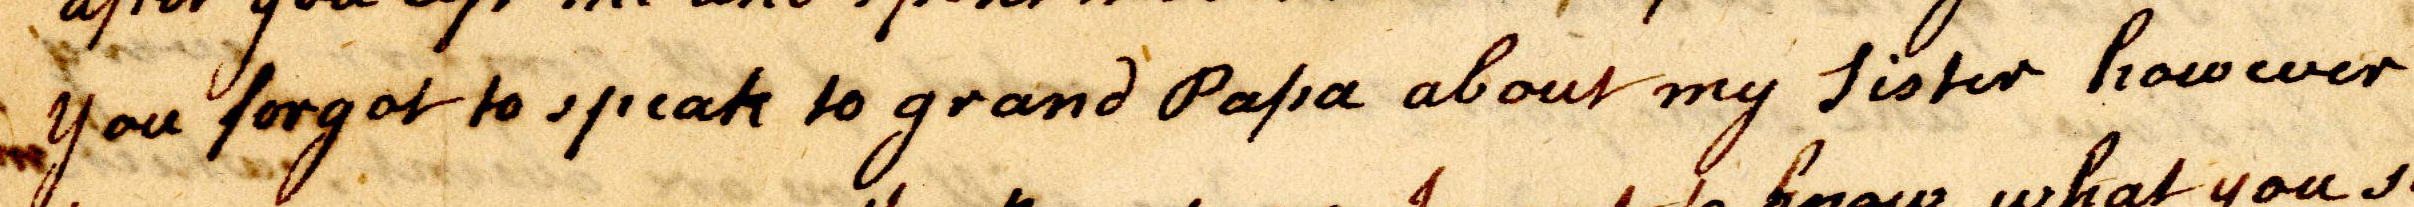You forgot to speak to grand Papa about my Sister however
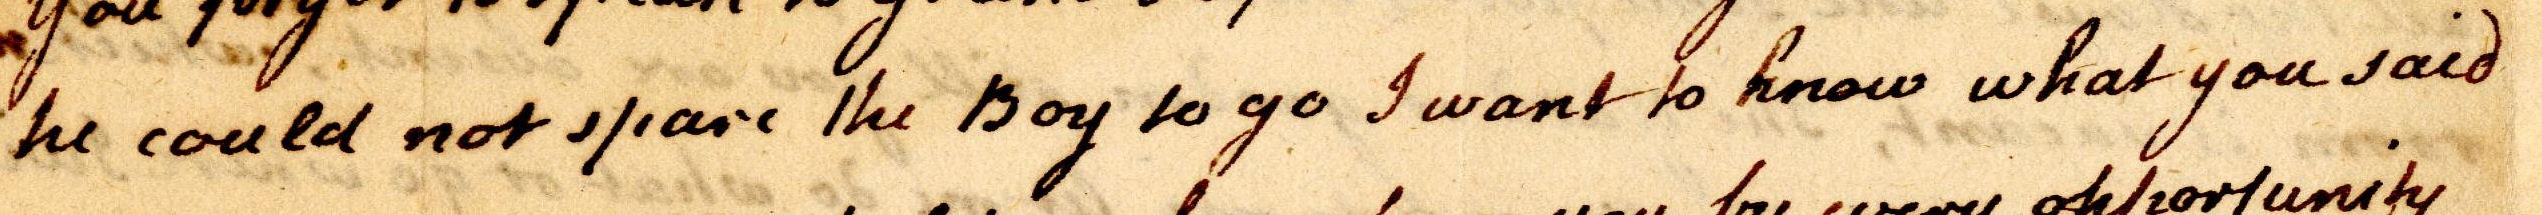he could not spare the Boy to go I want to know what you said
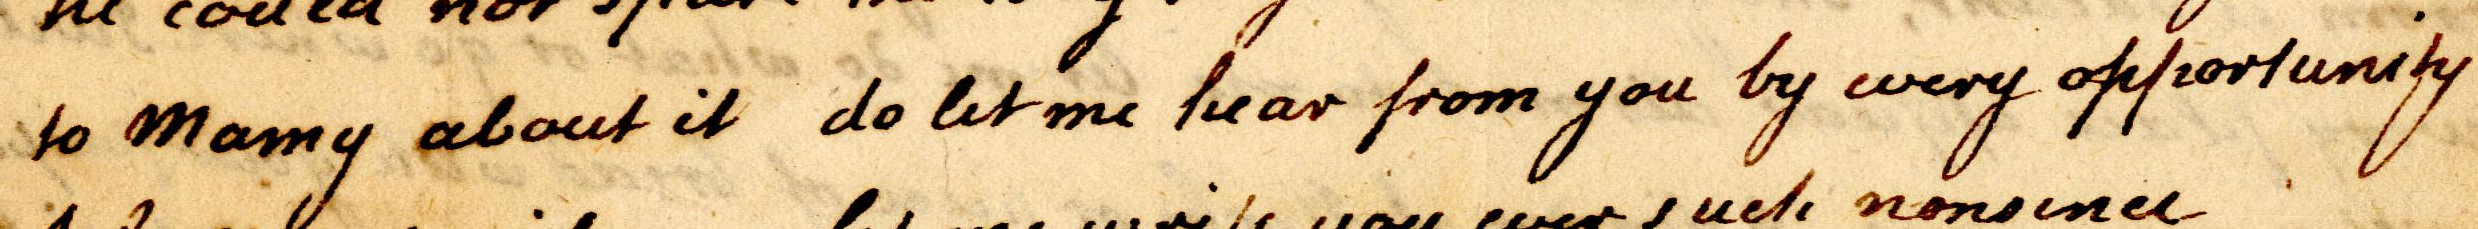to Mamy about it do let me hear from you by every opportunity
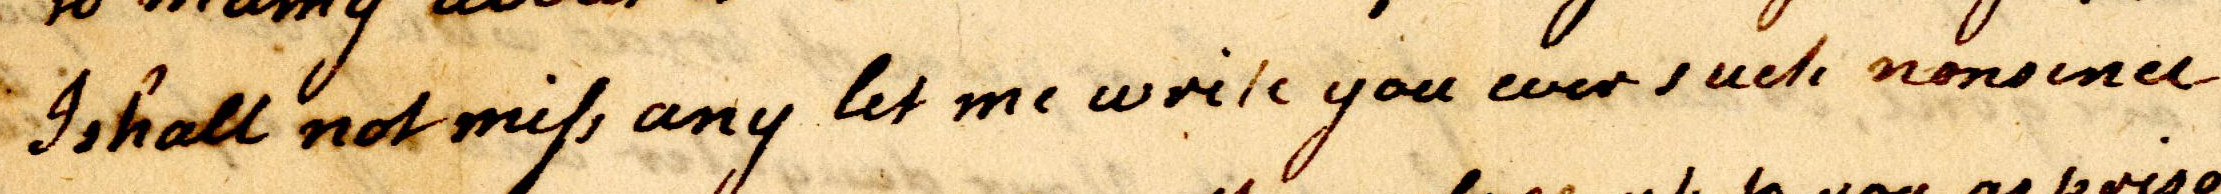I shall not miss any let me write you ever such nonsence
